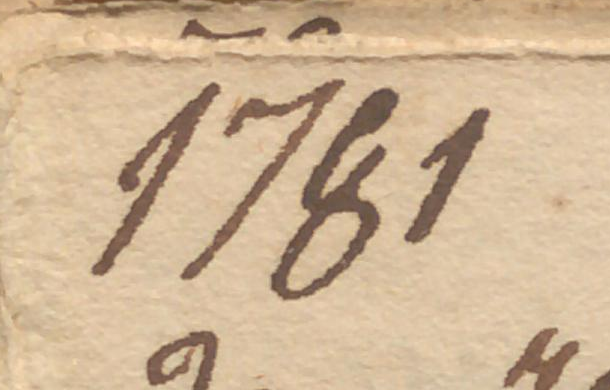1781
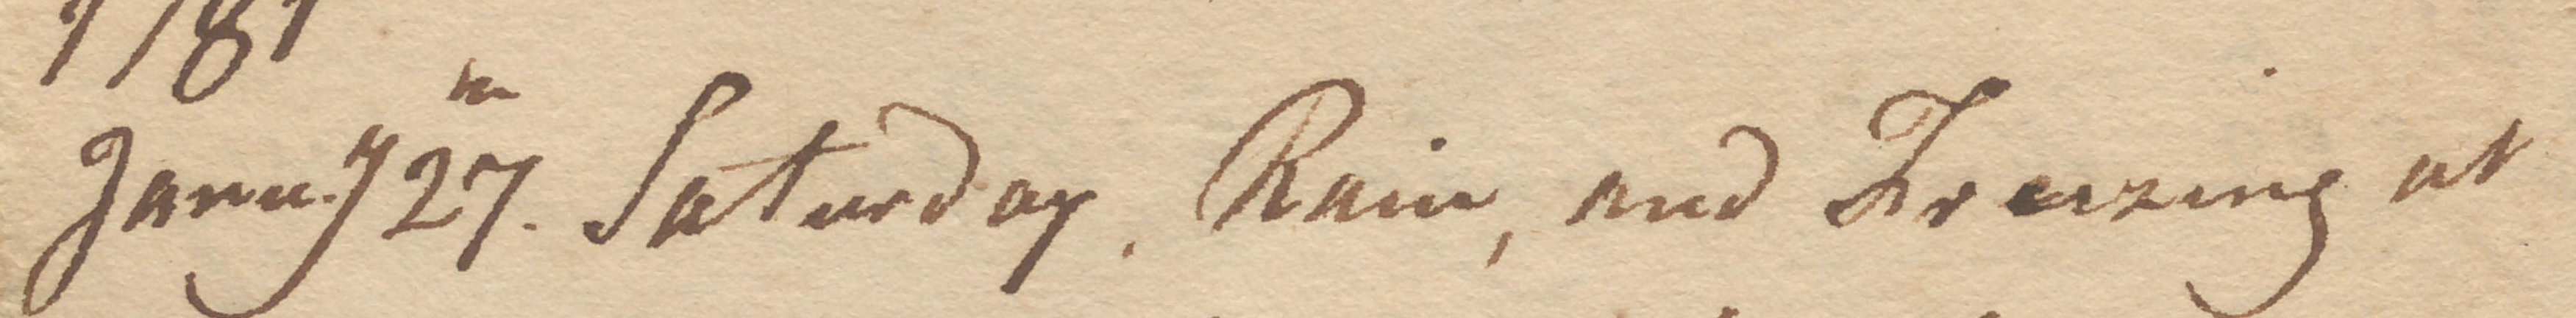Janu^y 27^th. Saturday. Rain, and Freezing at
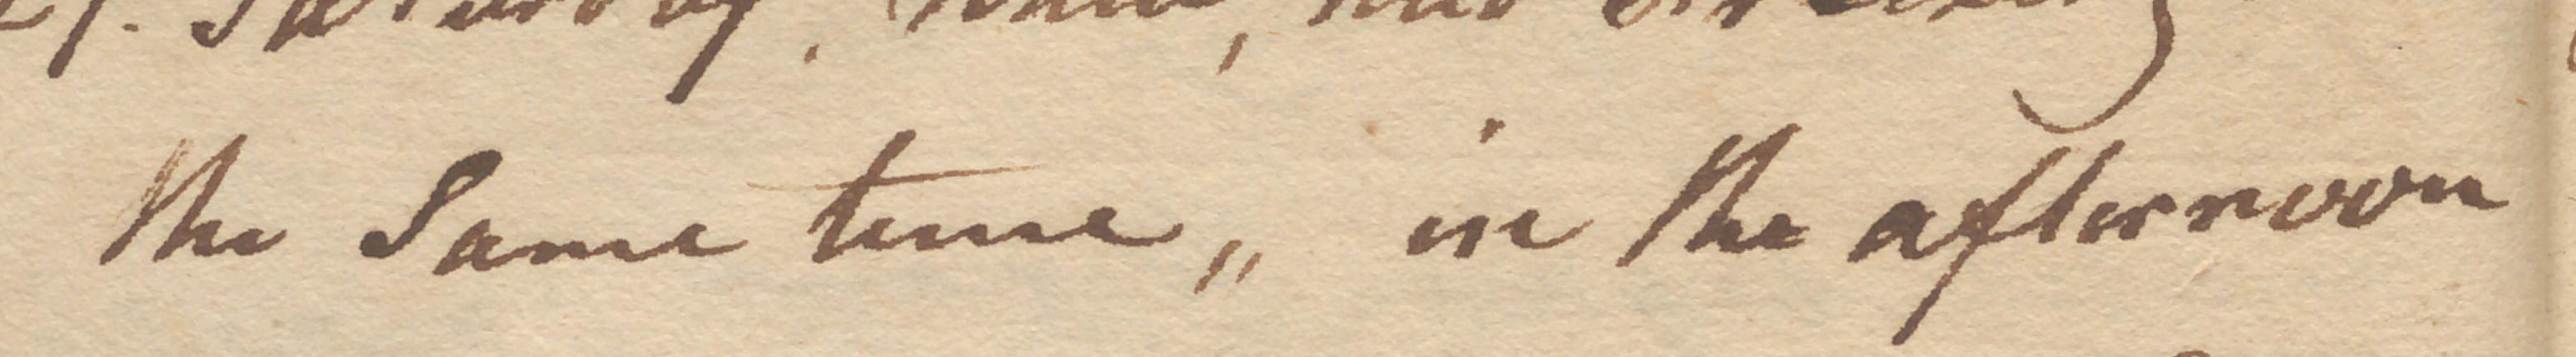the Same time, in the afternoon
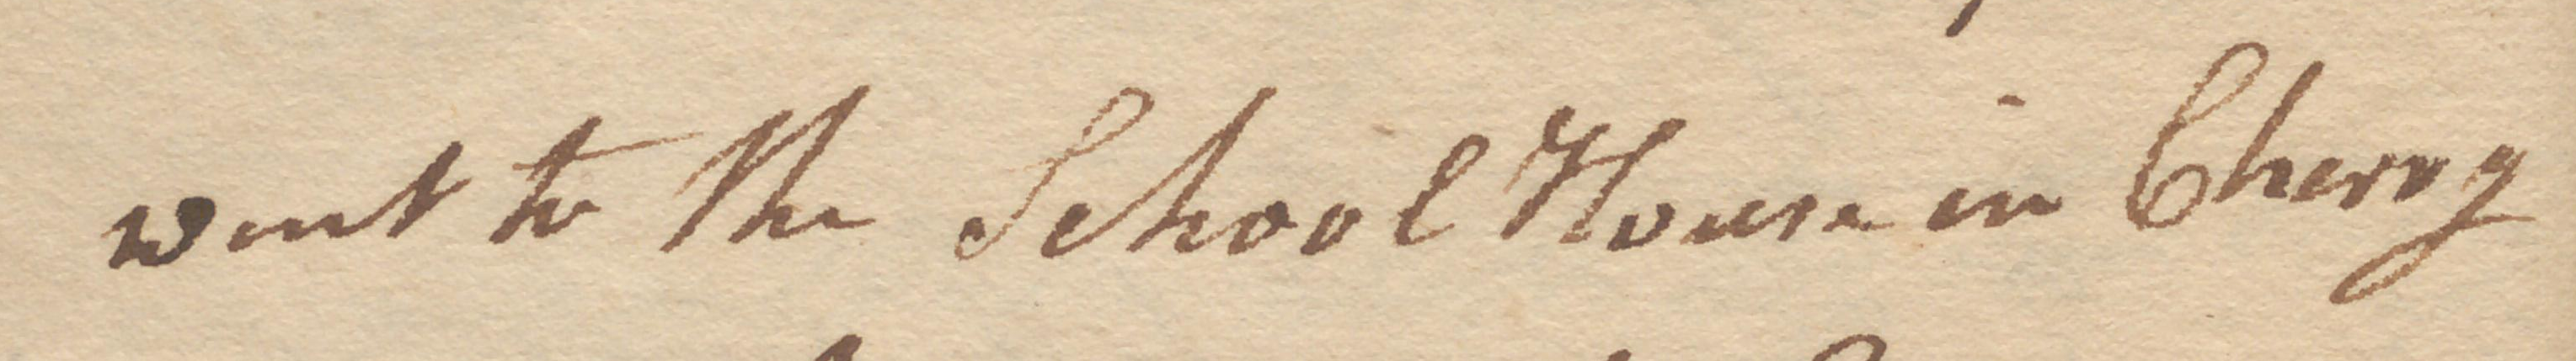went to the School House in Cherry
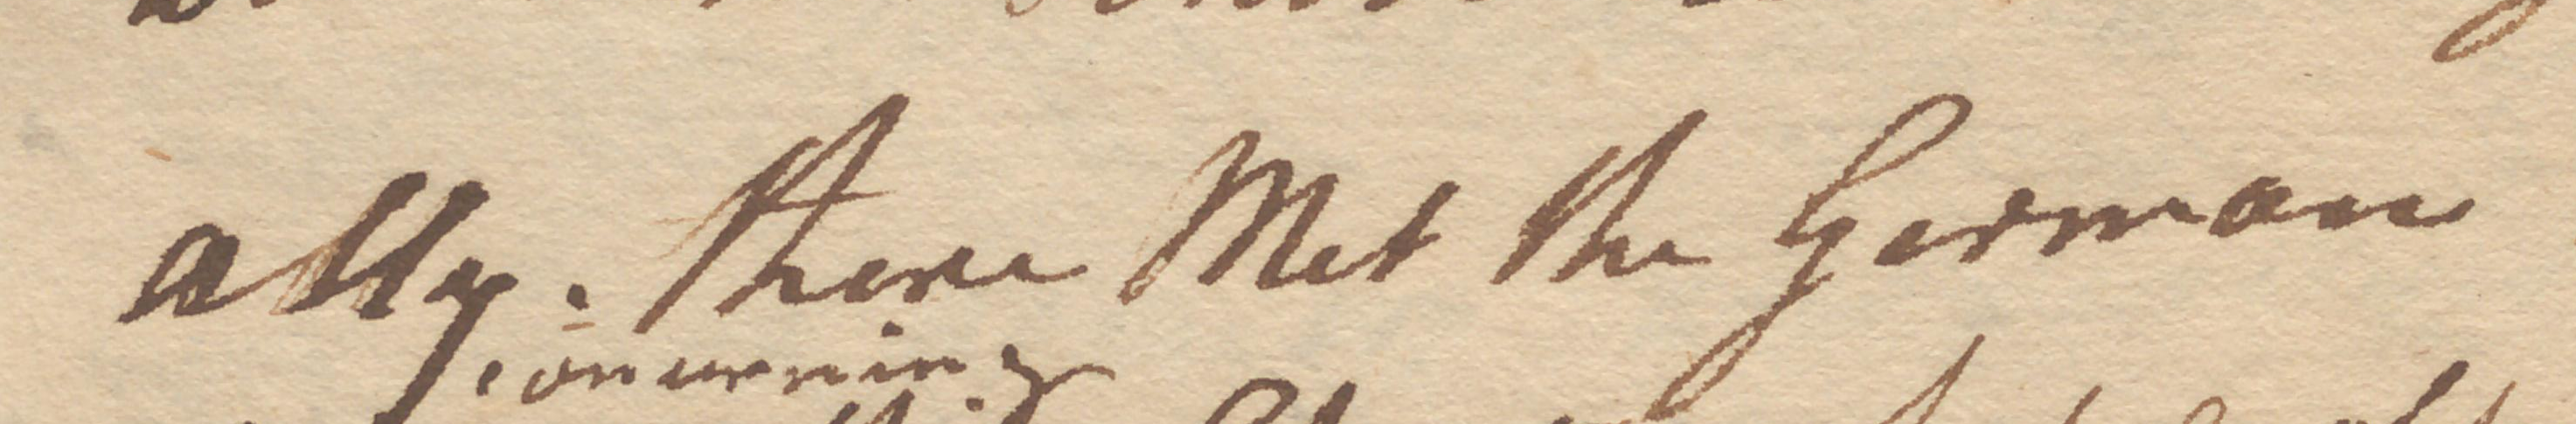ally. there Met the German
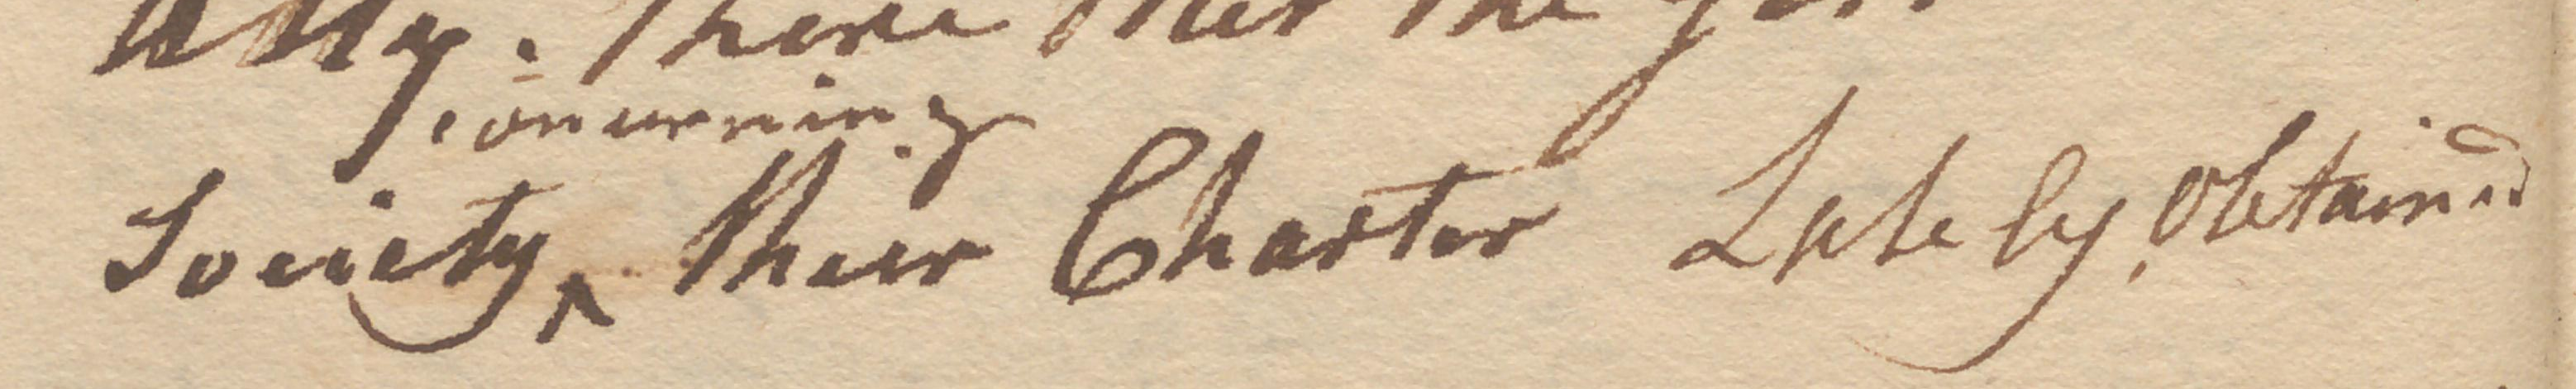Society ^ their Charter Lately obetained
